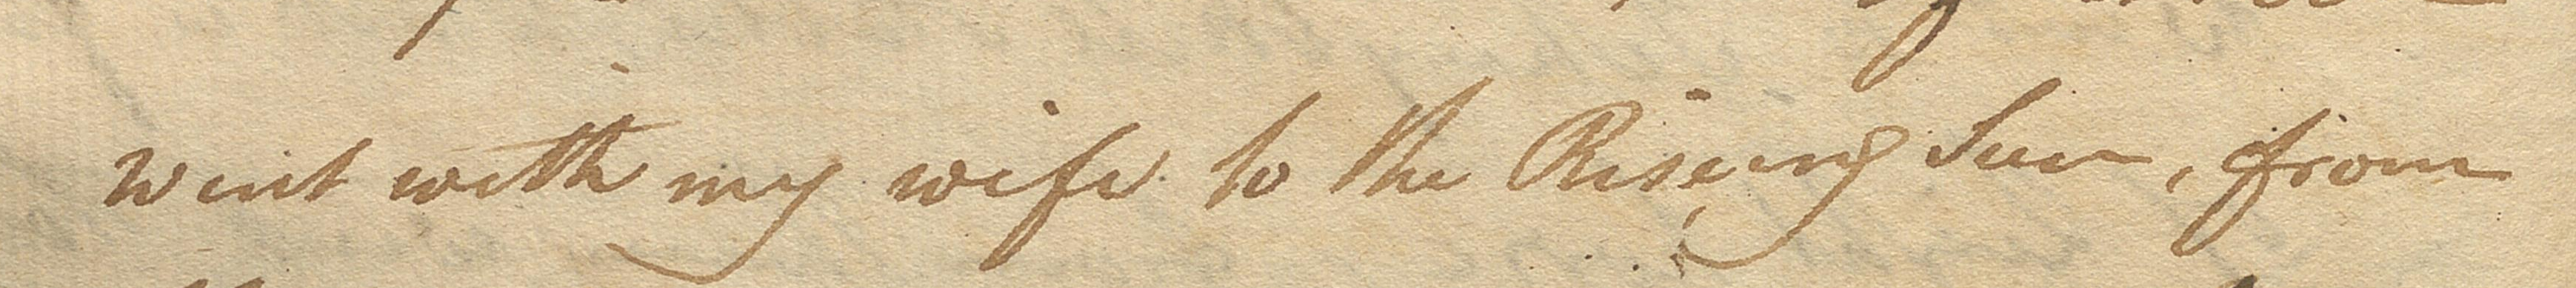went with my wife to the Riseing Sun, from
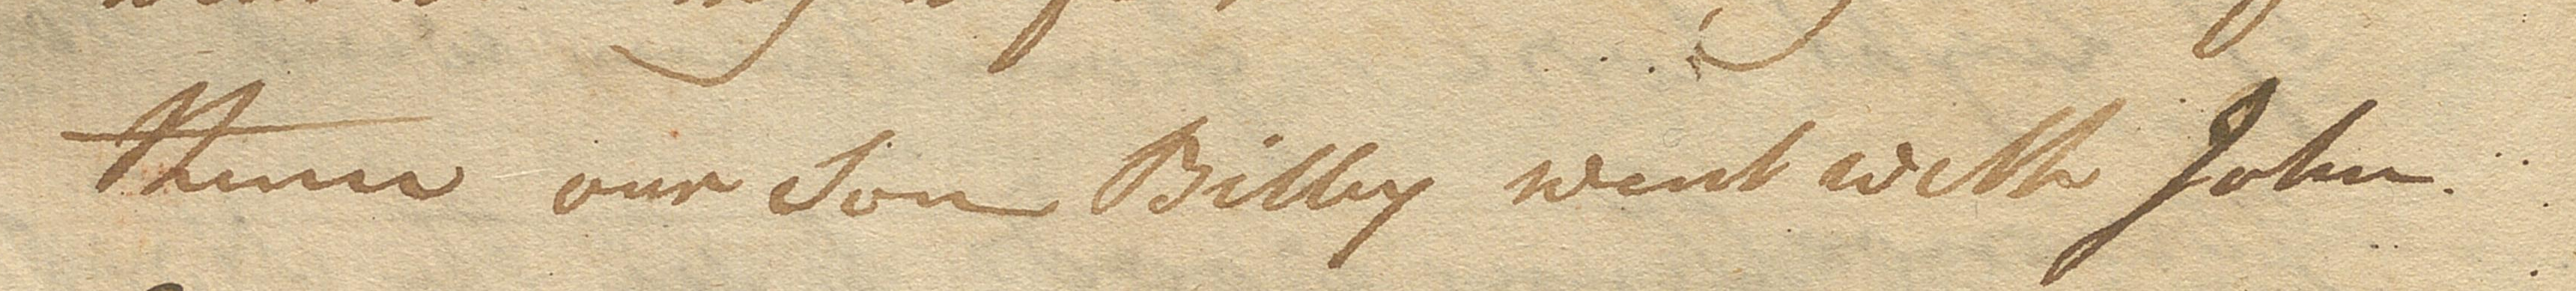thence our Son Billey went with John
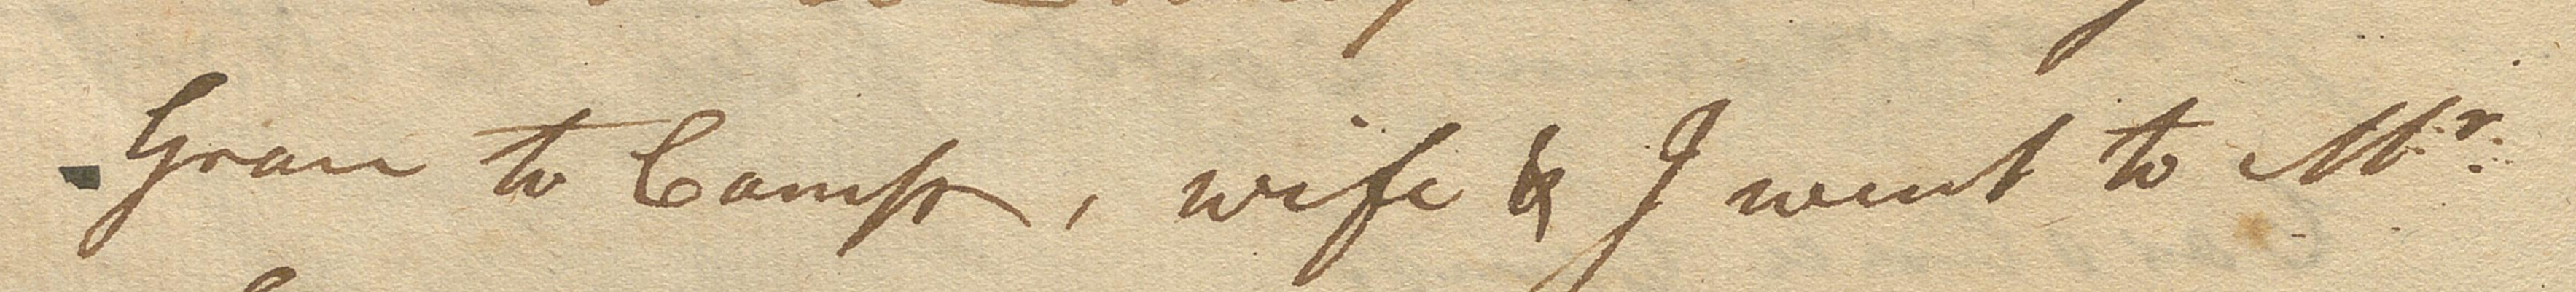Grau to Camp, wife & I went to M^r.
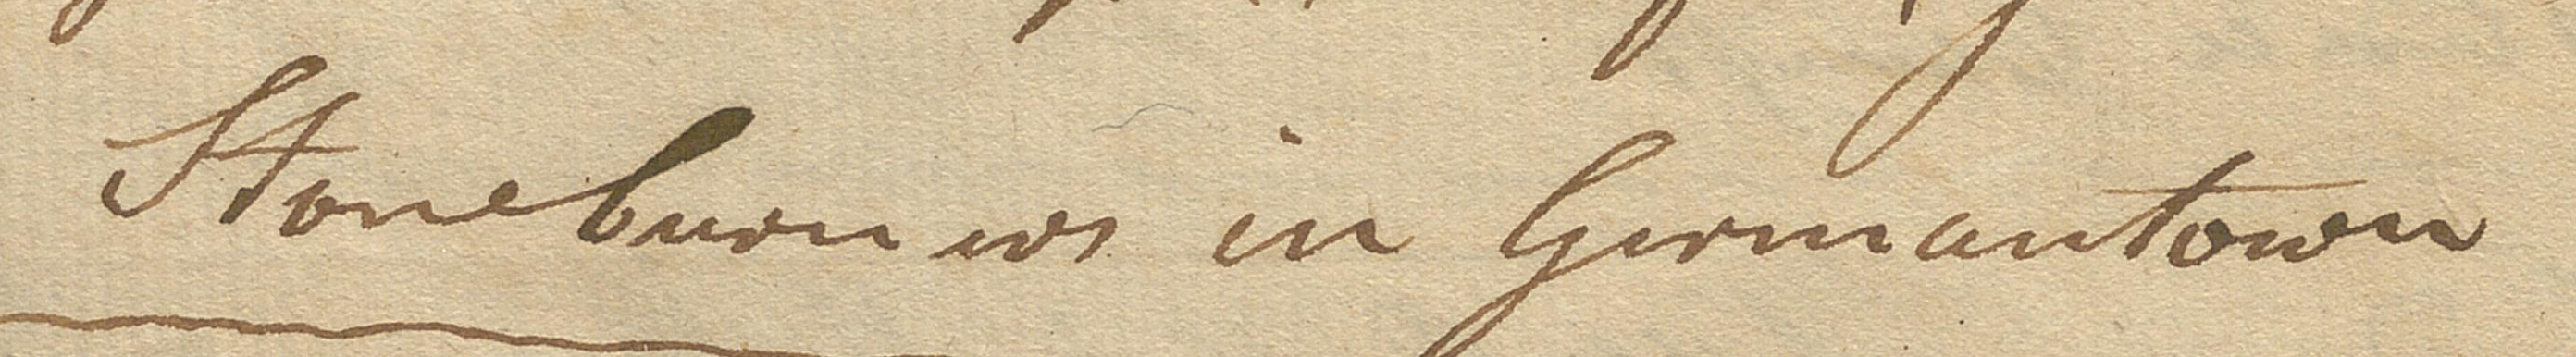Stoneburners in Germantown
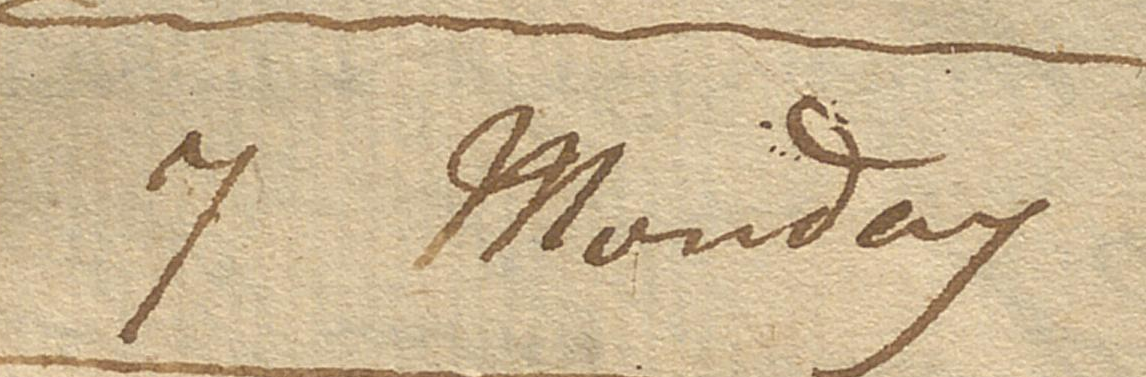7 Monday
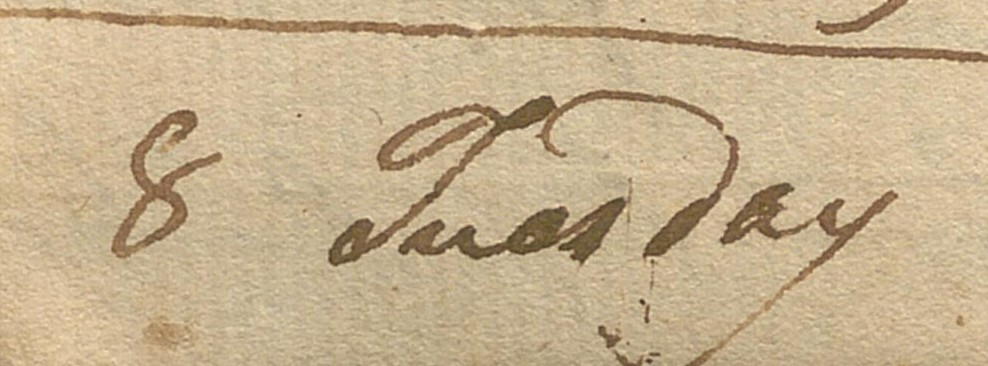8 Tuasday
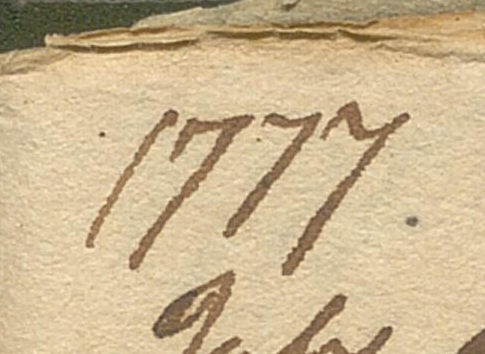1777
